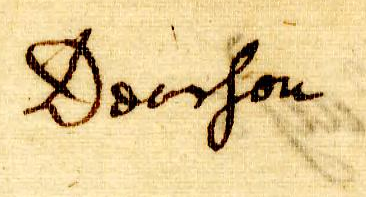Dear Son
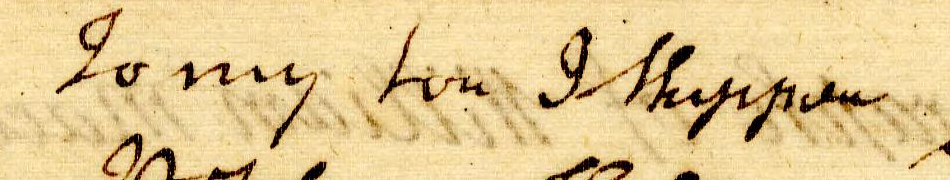To my son J Shippen
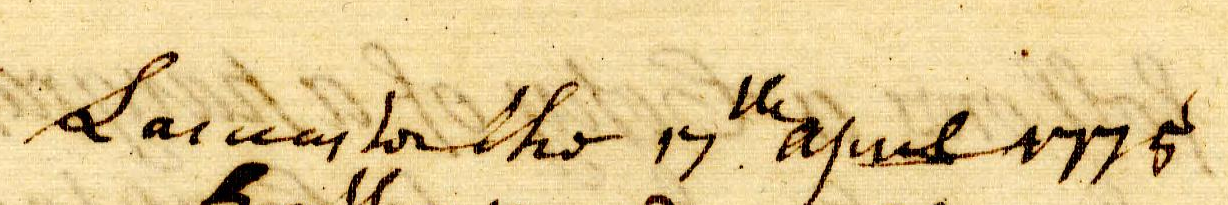Lancaster the 17.^th August 1775
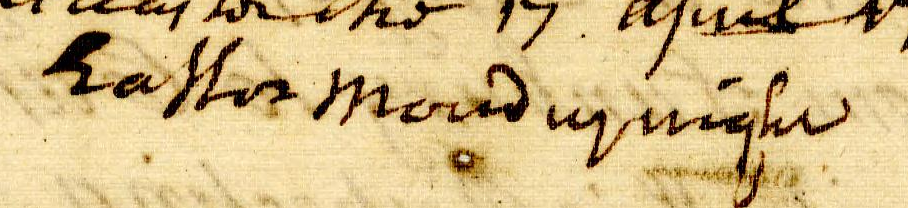rather mending night
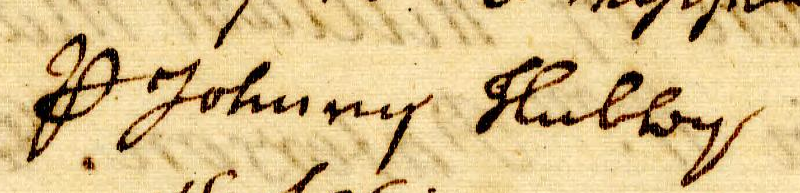per Johnny Hubbey
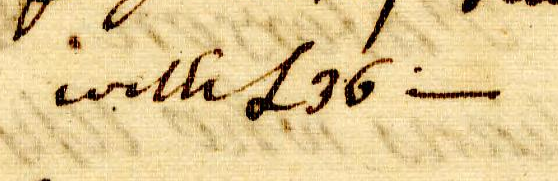with £36-
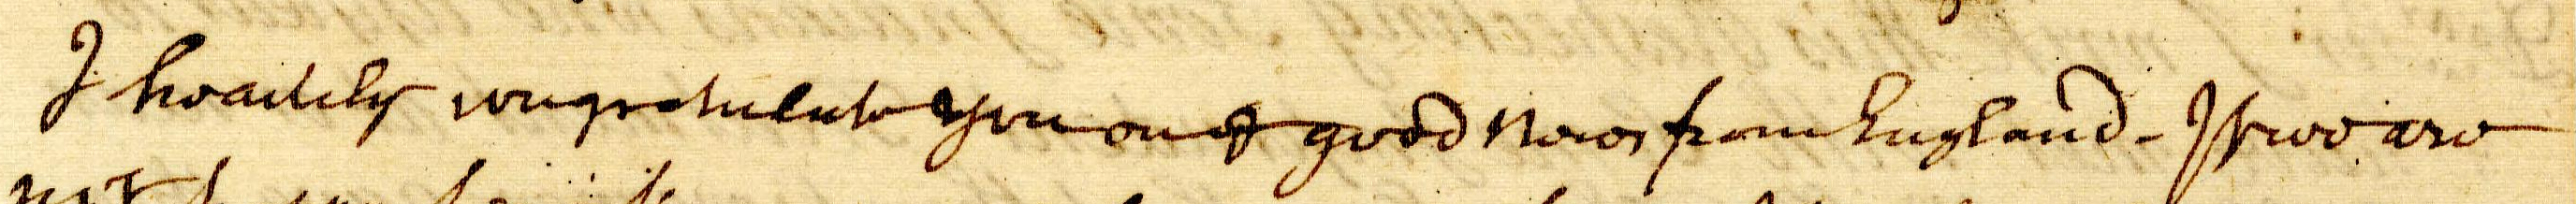I heartily congratulate You on & good News from England- Prue are
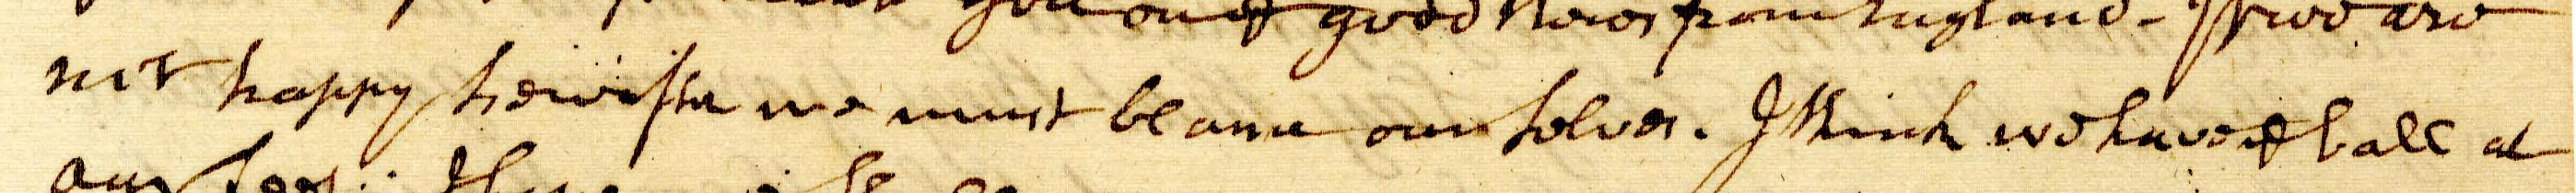not happy howelse we must blame our Selves. I think we have y^e ball at
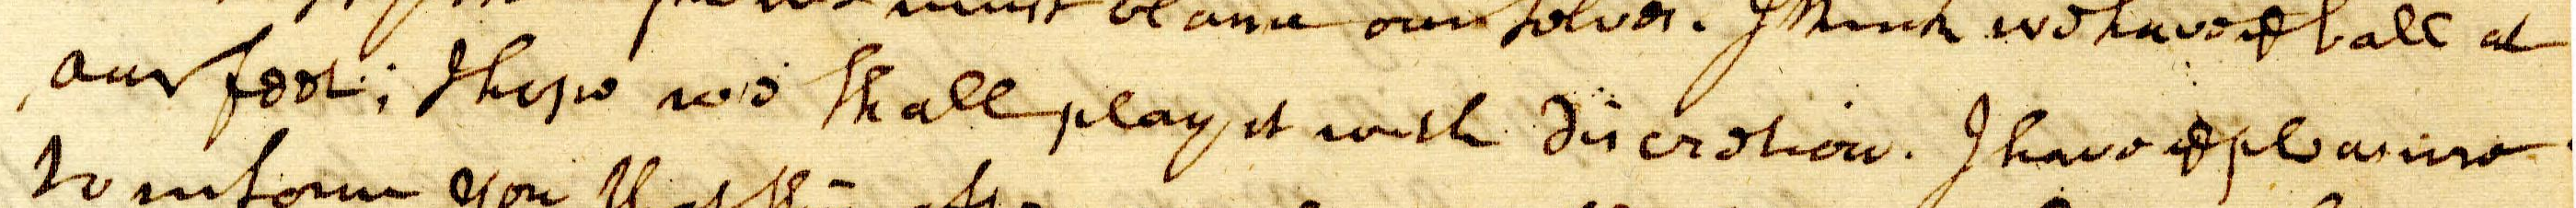our foot; I hope we shall play it will discretion. I have y^e pleasure
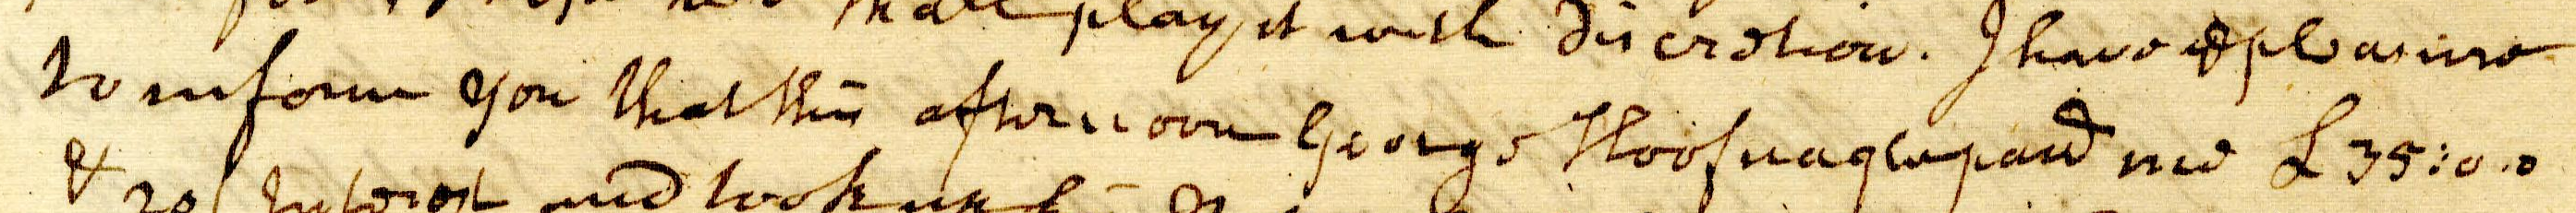to inform You that this afternoon George Hoofnagle paid me L35:0.0
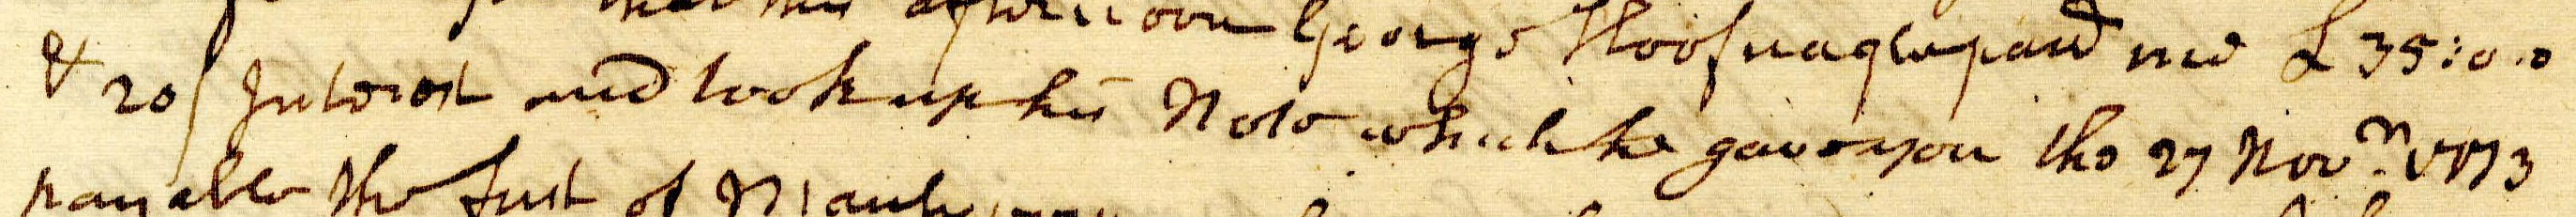& 20/ Interest and look up his Note which he gave you the 7 Nov^r. 1773
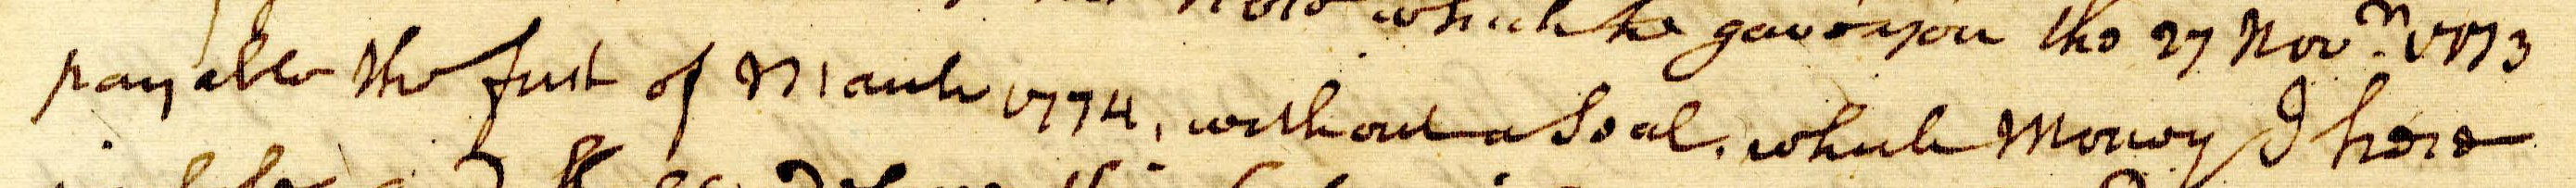payable the first of March 1774, without a Seal, which Money I have
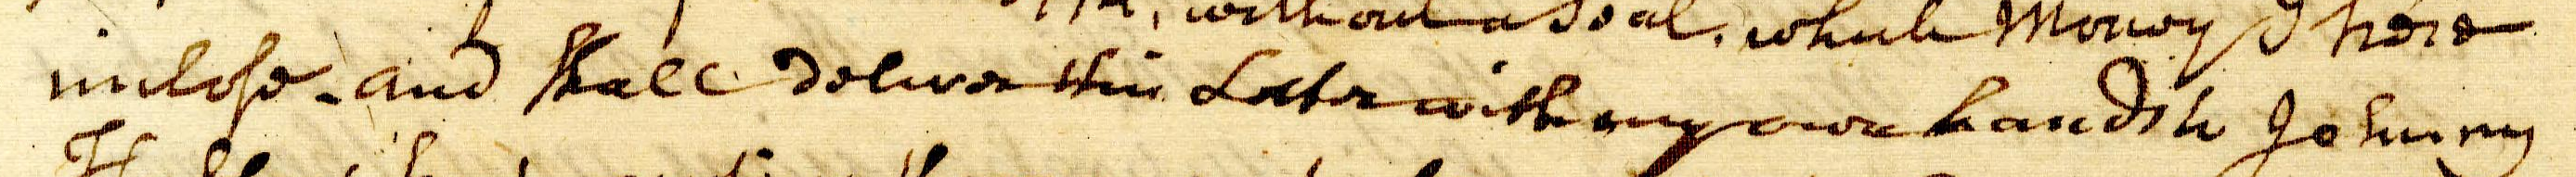in loss. and shall deliver this Letter with my own hands to Johnny
